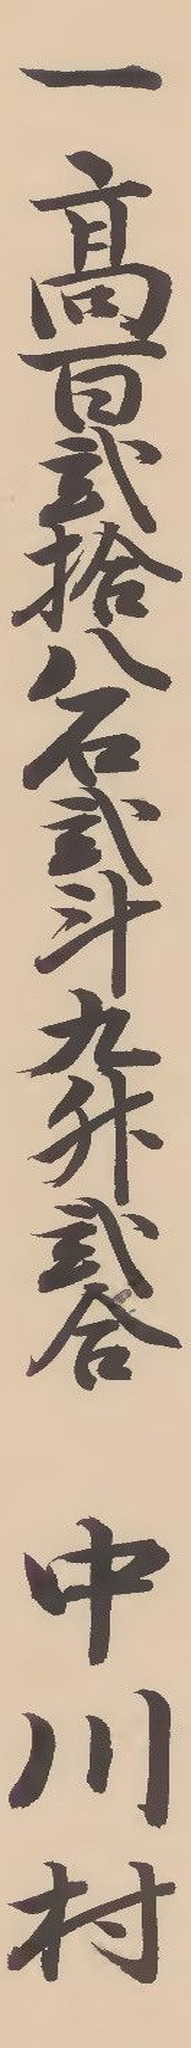一高百弐拾八石弐斗九升弐合中川村

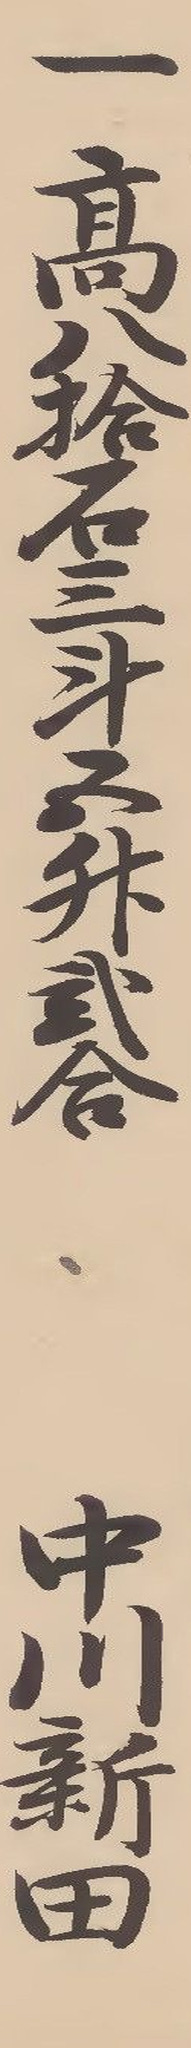一高八拾石三斗五升弐合中川新田
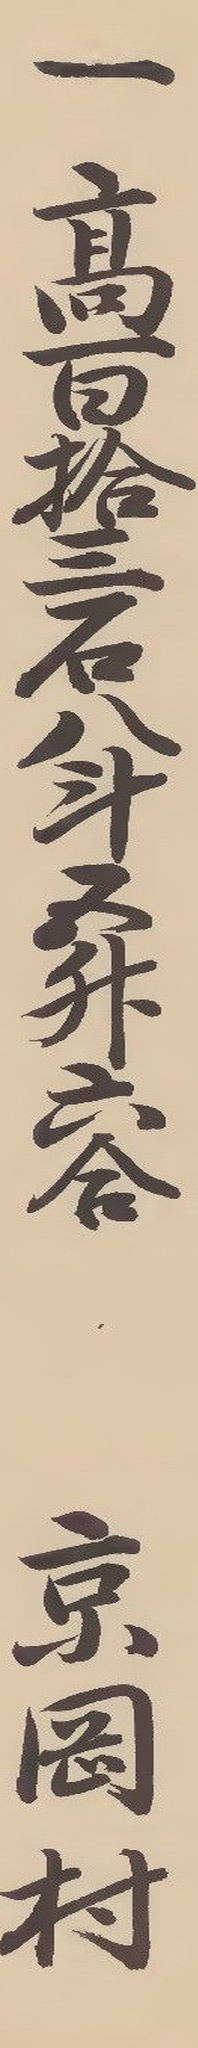一高百拾三石八斗五升六合京岡村
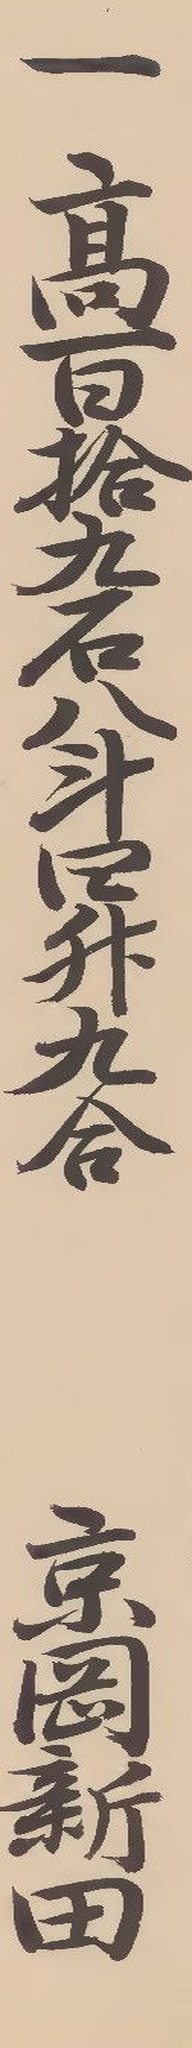一高百拾九石八斗四升九合京岡新田
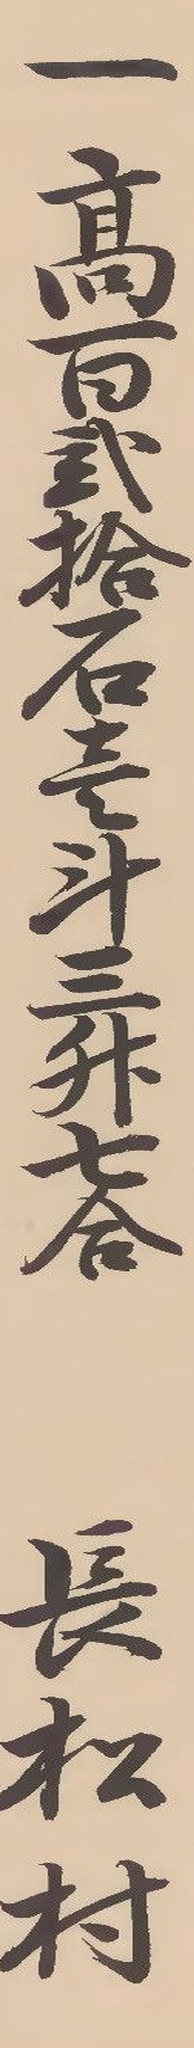一高百弐拾石壱斗三升七合長松村
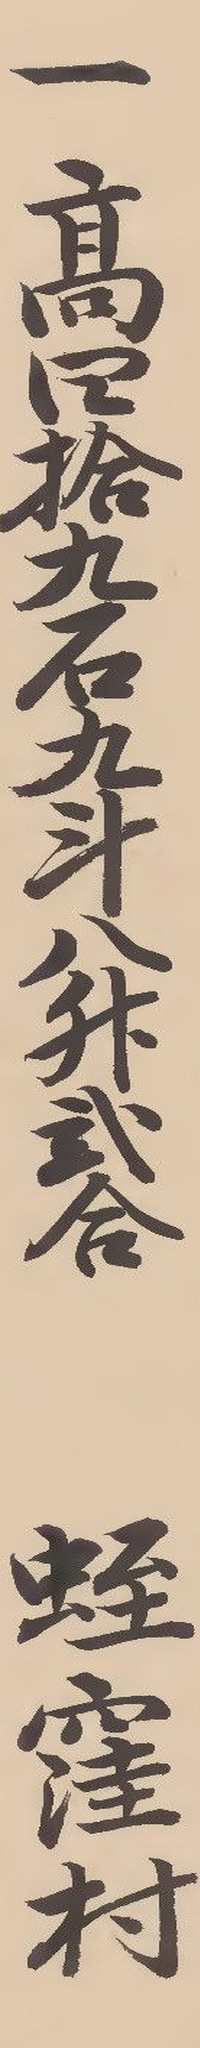一高四拾九石九斗八升弐合蛭窪村
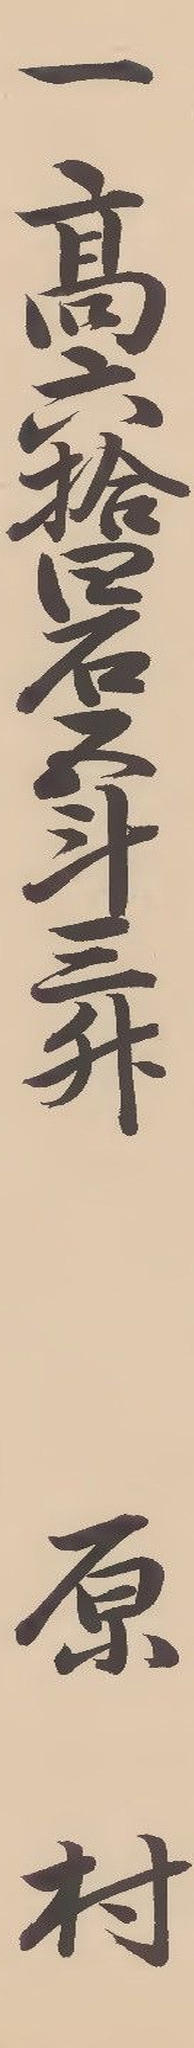一高六拾四石五斗三升原村
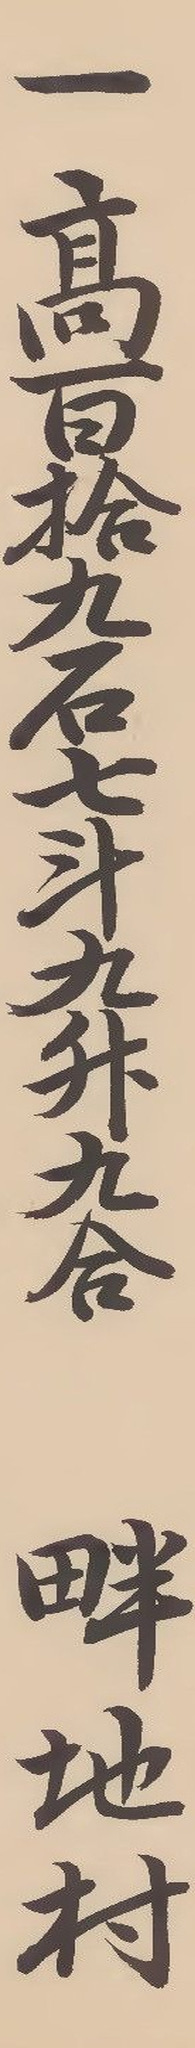一高百拾九石七斗九升九合畔地村
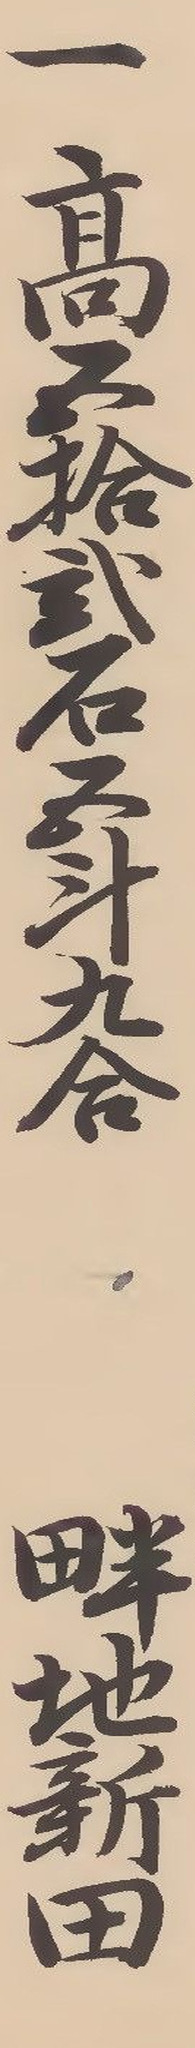一高五拾弐石五斗九合畔地新田

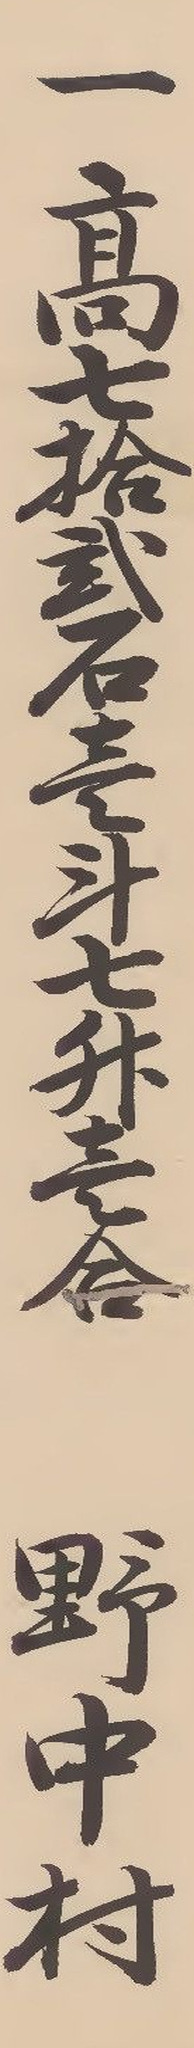一高七拾弐石壱斗七升壱合野中村
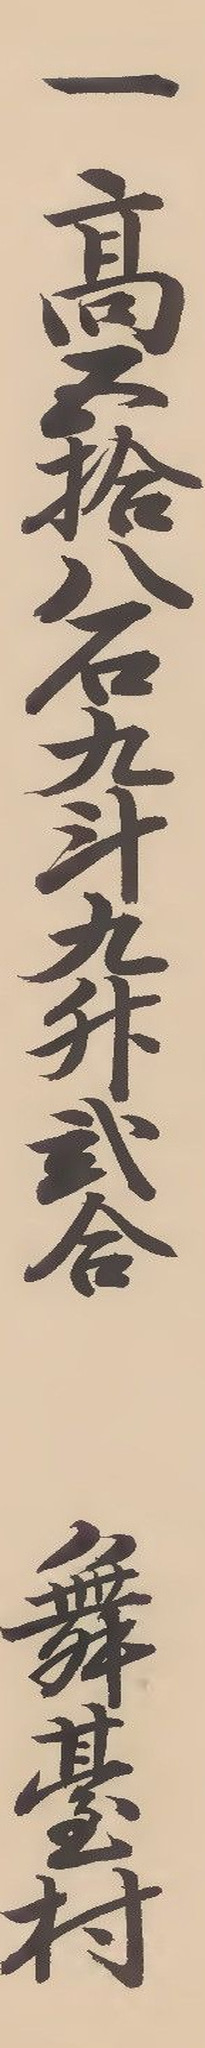一高五拾八石九斗九升弐合舞台村
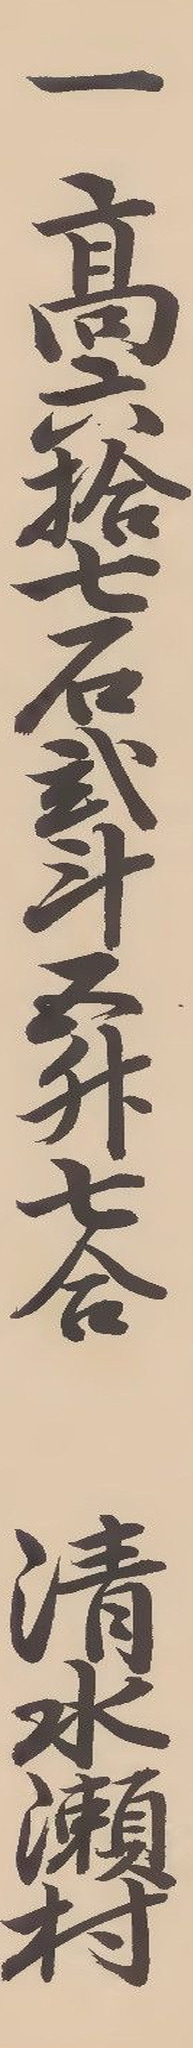一高六拾七石弐斗五升七合清水瀬村
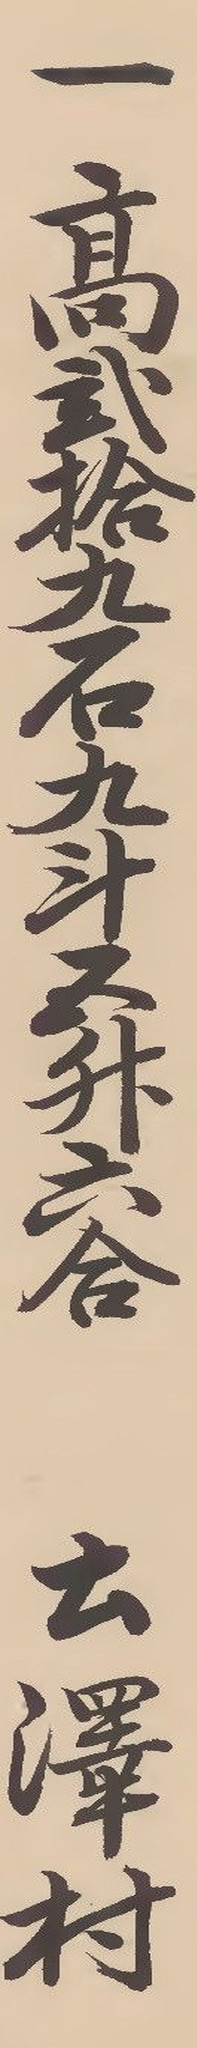一高弐拾九石九斗五升六合土沢村
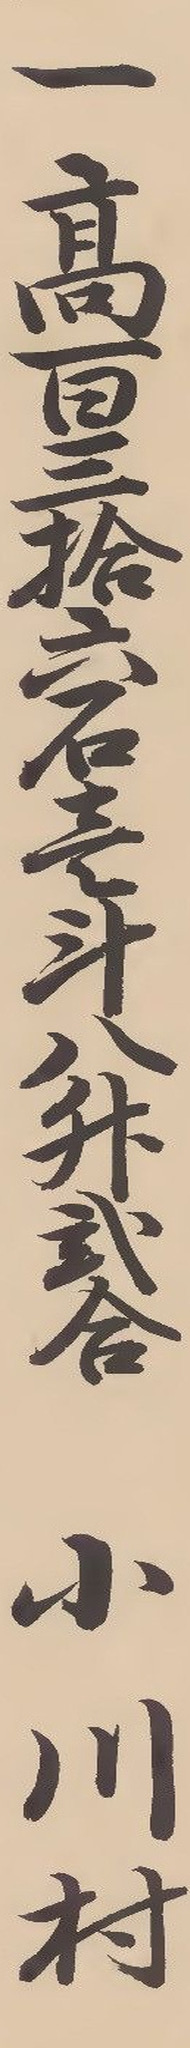一高百三拾六石壱斗八升弐合小川村
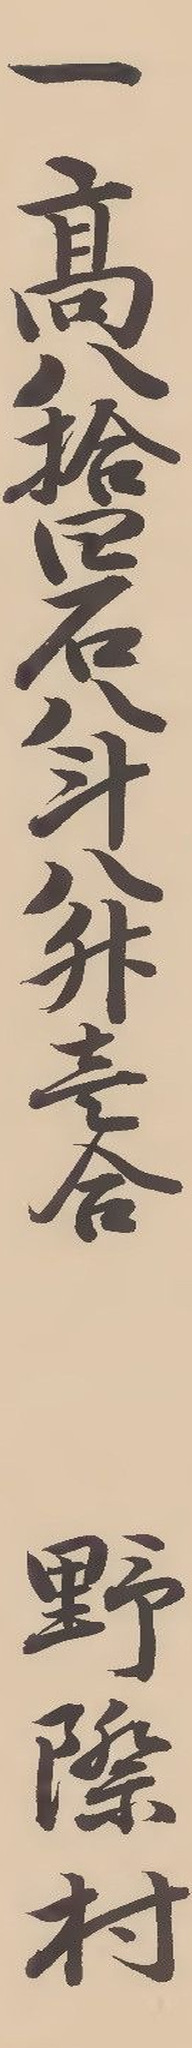一高八拾四石八斗八升壱合野際村
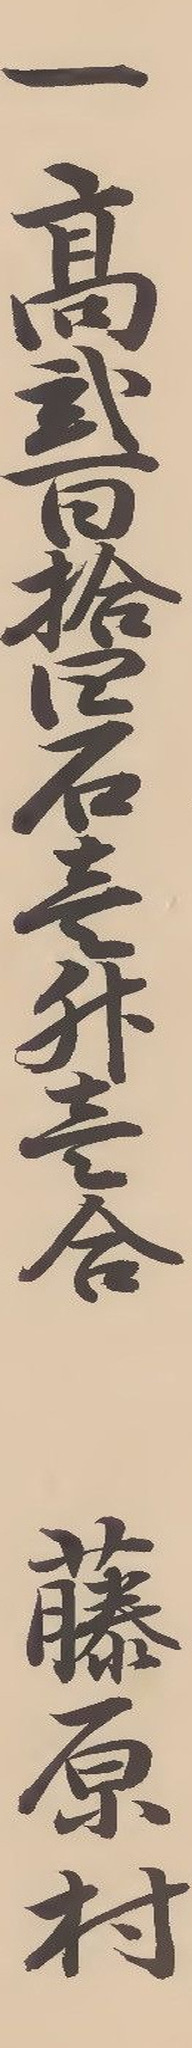一高弐百拾四石壱升壱合藤原村
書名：越後国郷帳　中
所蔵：国立公文書館 National Archives of Japan
